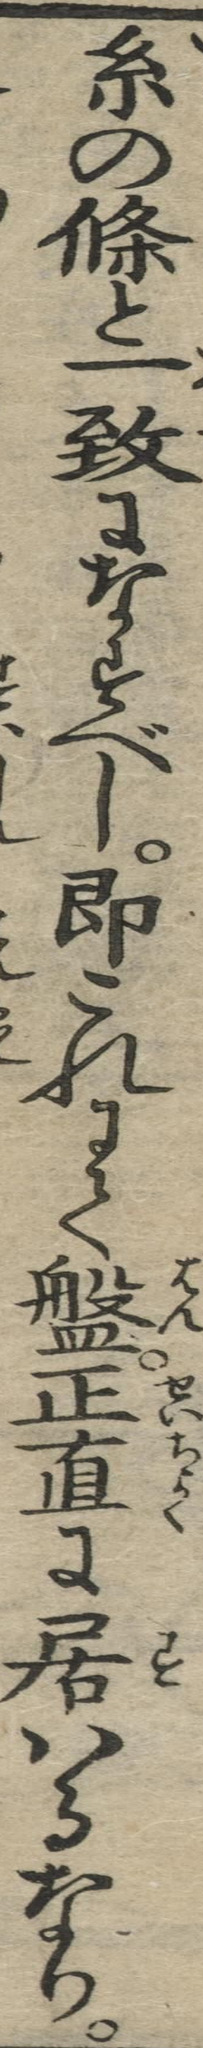糸の条と一致になすべし。即これにて盤。正直に居はるなり。
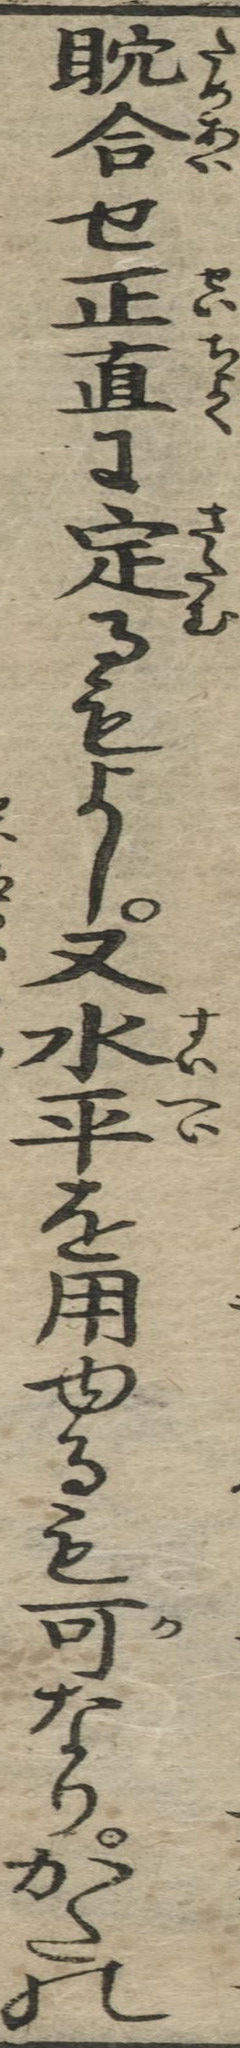耽合せ正直に定るもよし。又水平を用ゆるも可なり。かたの
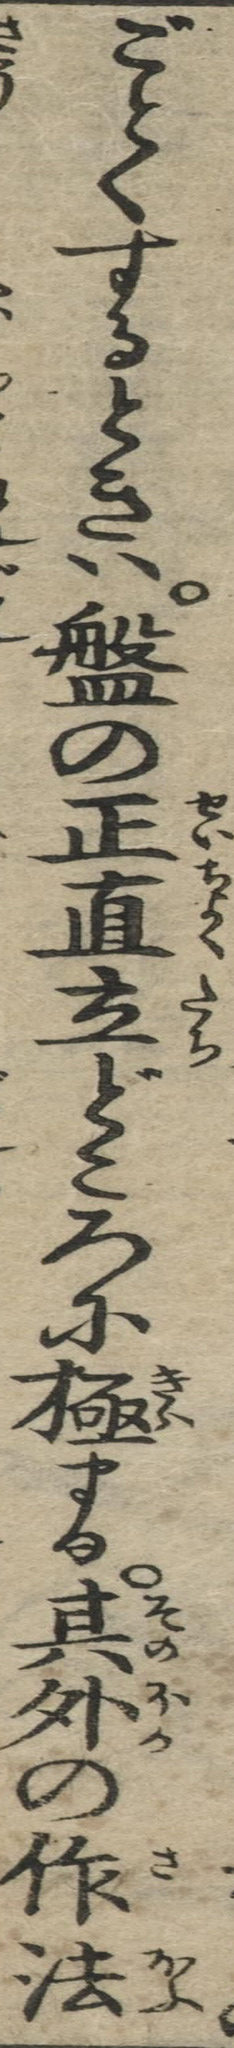ごとくするときは。盤の正直立どころに極する。其外の作法
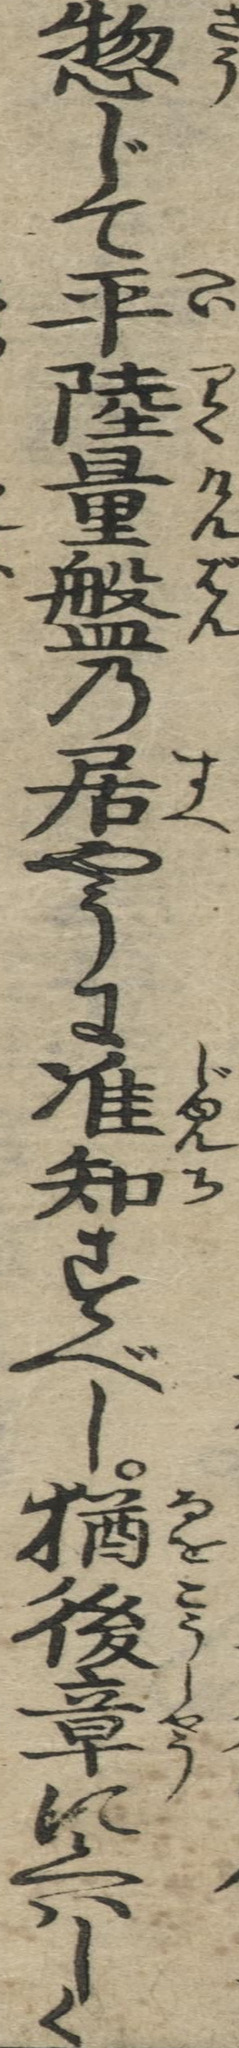惣じて平陸量盤乃居やうに准知すべし。猶後章にくはしく
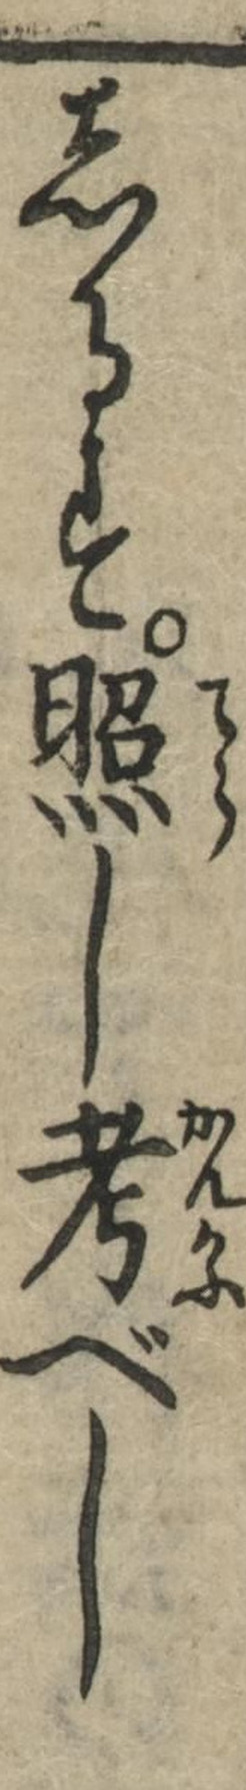しるす。照し考べし

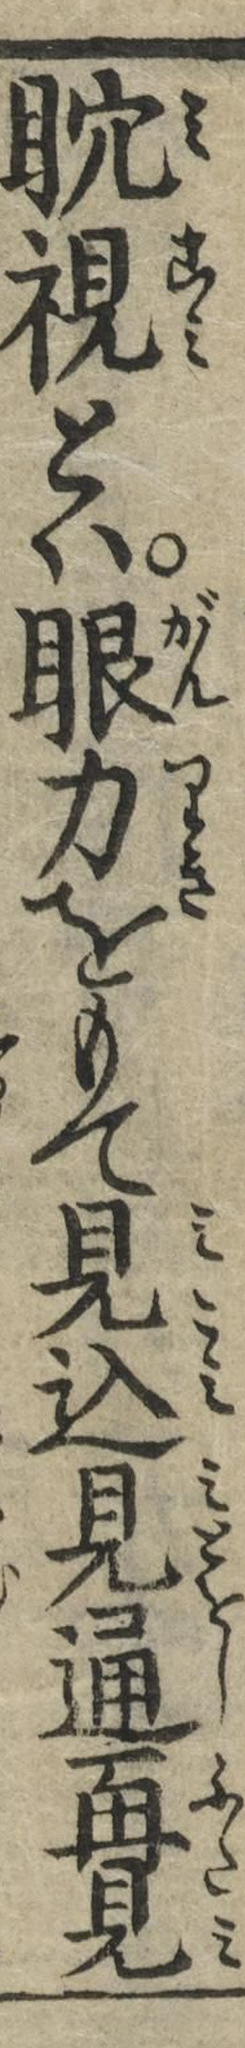耽視とは。眼力をもて見込見通再見
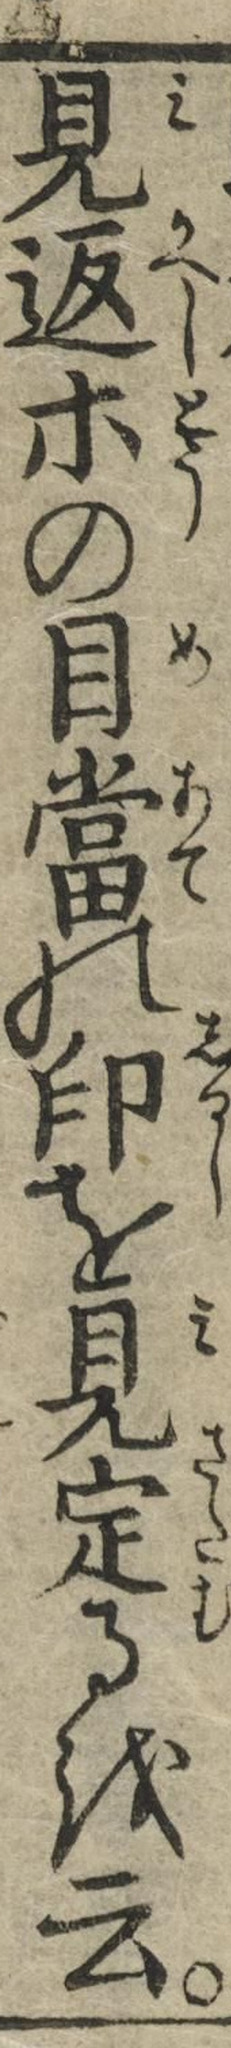見返等の目当の印を見定るを云。
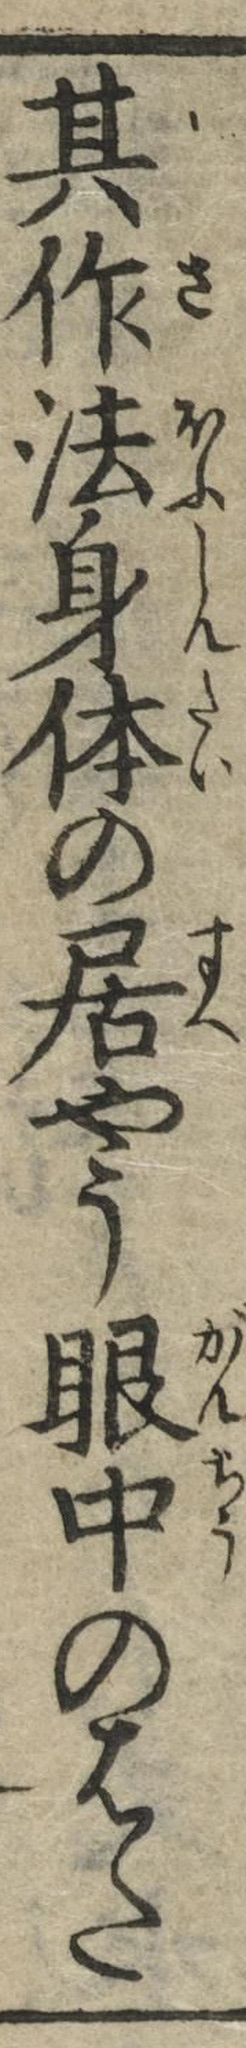其作法身体の居やう眼中のはた
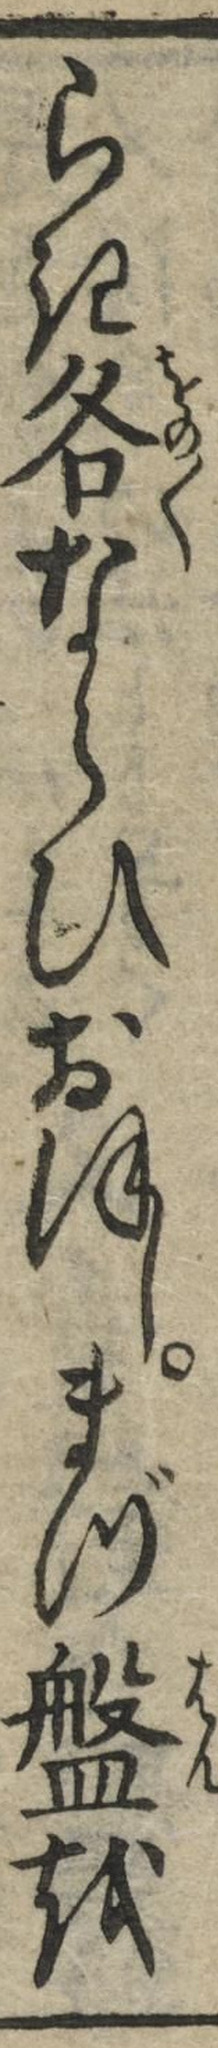らき各ならひおほし。まづ盤を
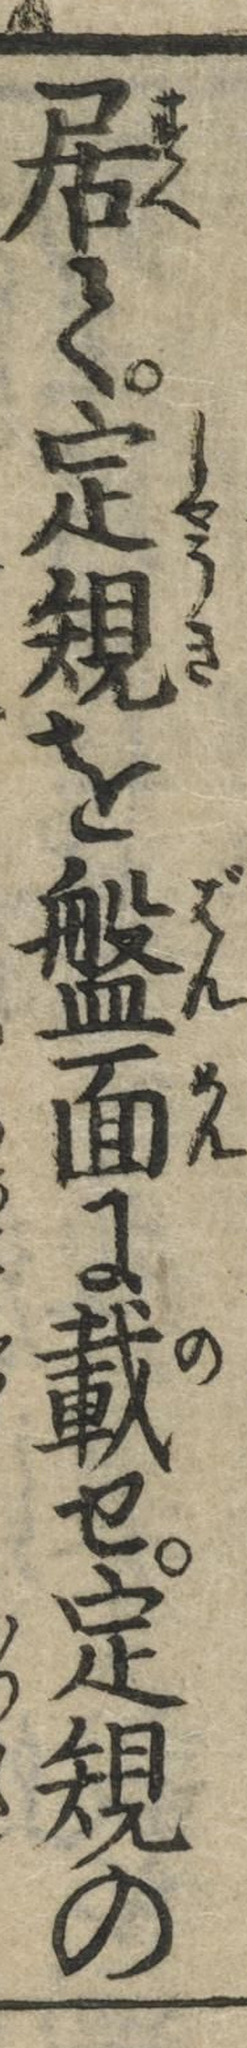居て。定規を盤面に載せ。定規の
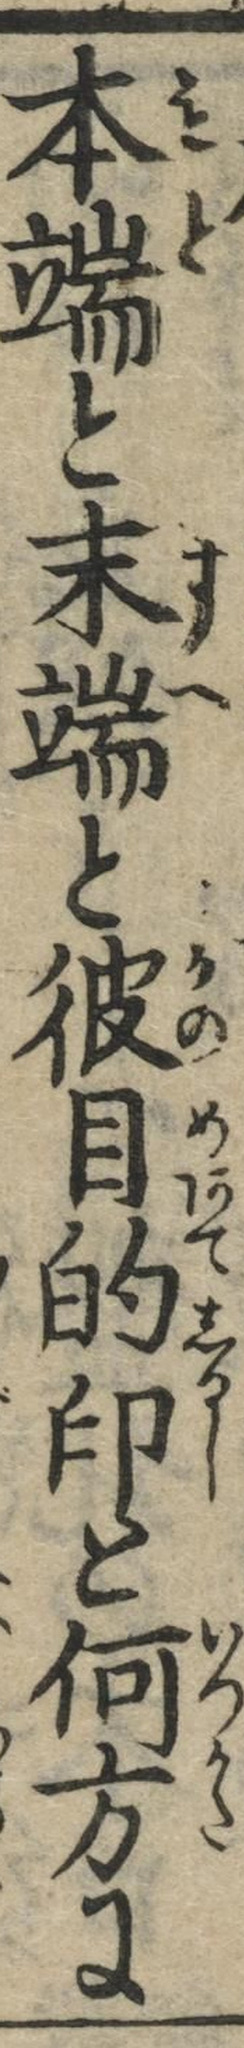本端と末端と彼目的印と何方に
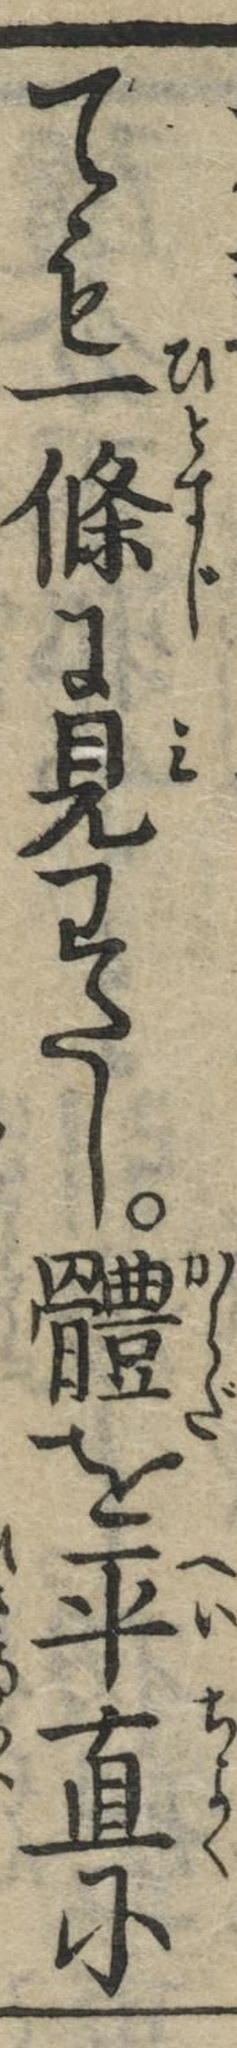ても一条に見わたし。体を平直に
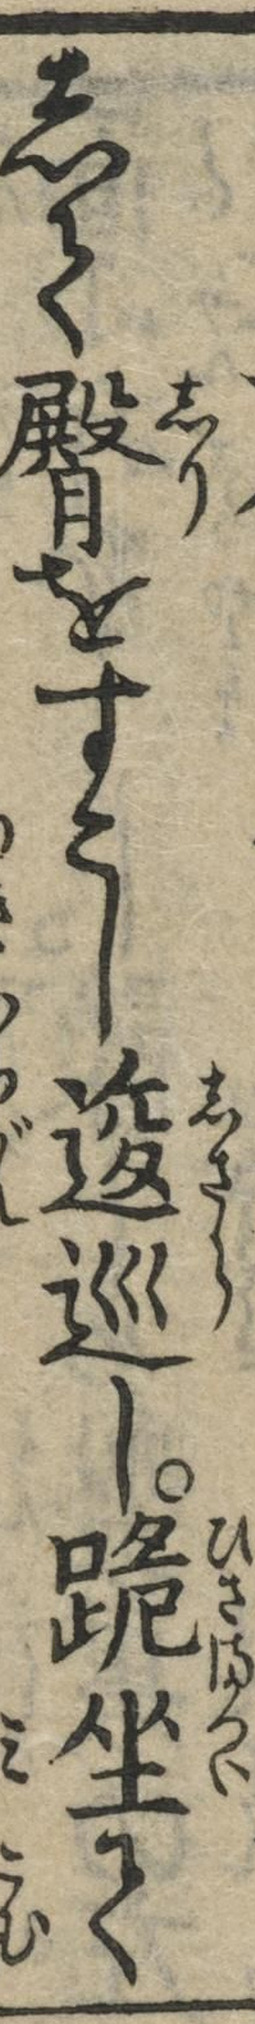して臀をすこし逡巡し。跪坐て
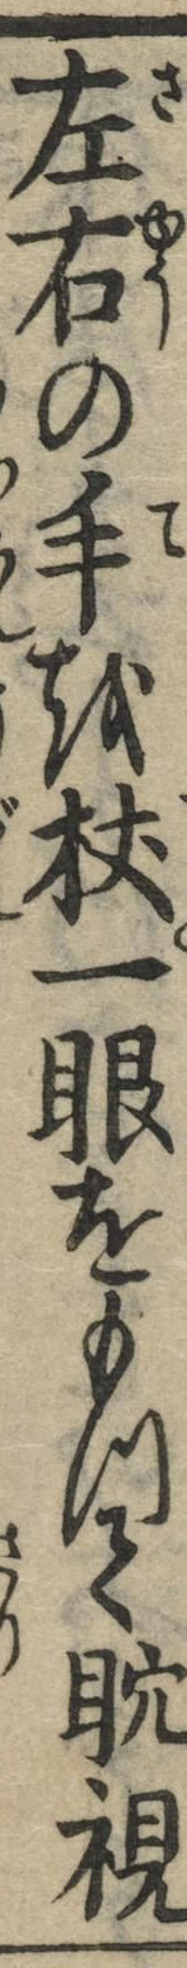左右の手を杖。一眼をもつて耽視
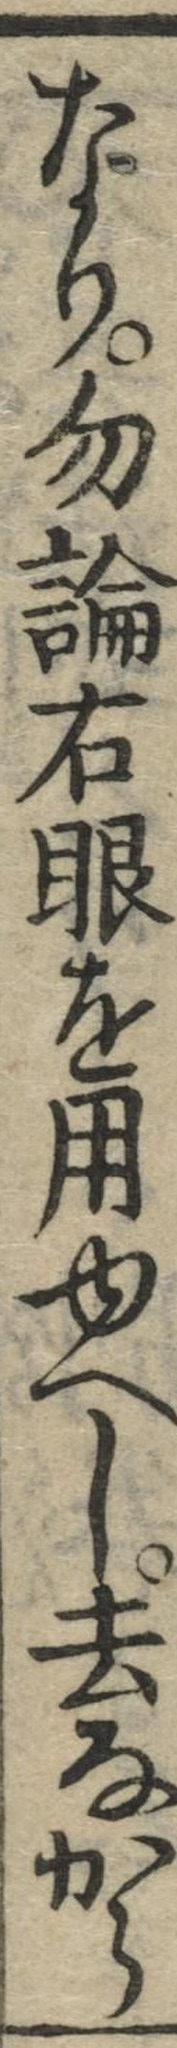なり。勿論右眼を用ゆへし。去ながら
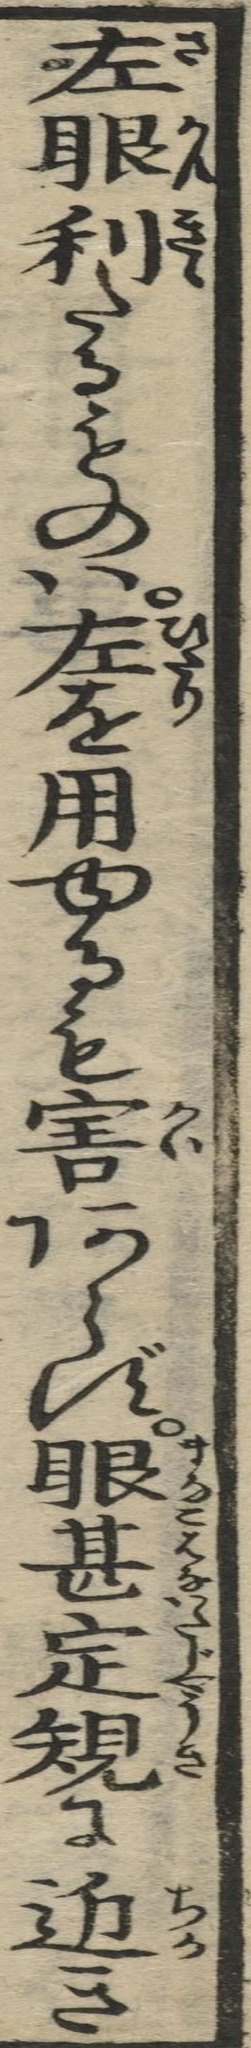左眼利たるものは。左を用ゆるも害あらず。眼甚定規に近き
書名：量地指南　巻之一（内題）
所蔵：東京大学地震研究所図書室 Earthquake Research Institute Library, The University of Tokyo, JAPAN
